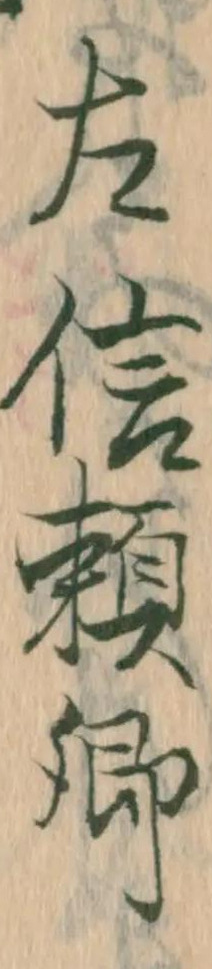左信頼卿
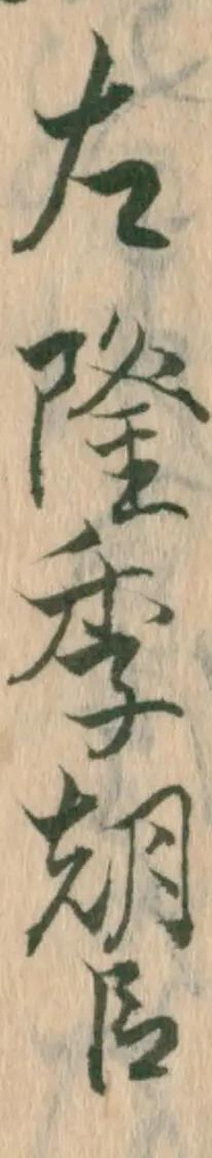左隆季朝臣
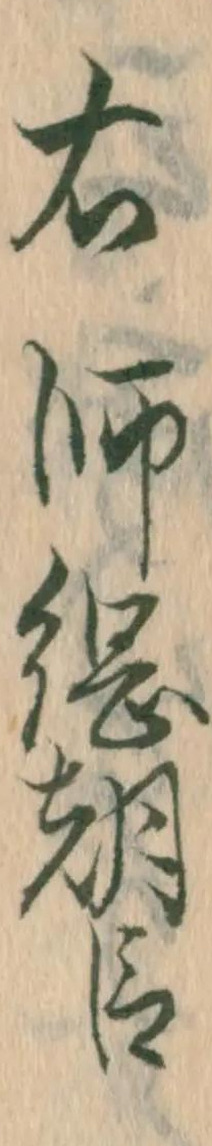右師綱朝臣
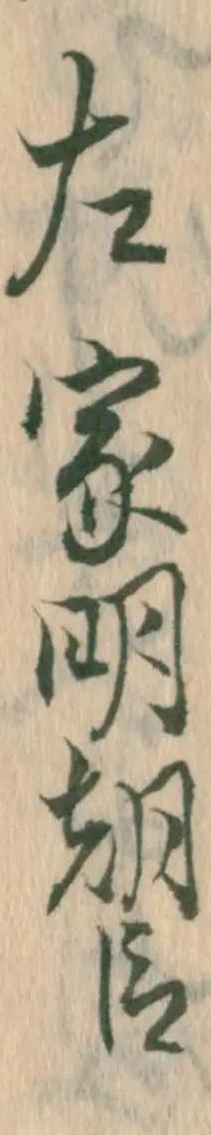左家明朝臣
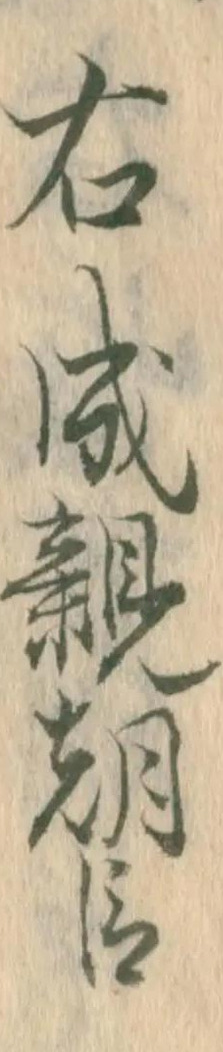右成親朝臣

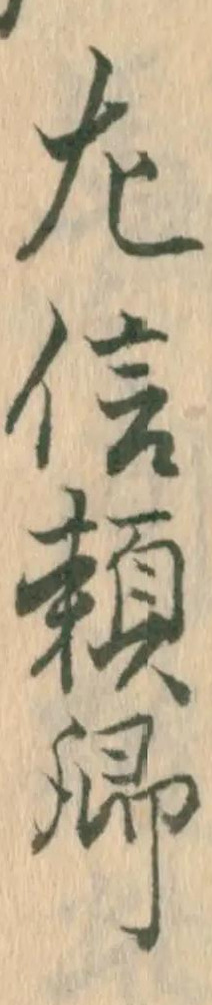左信頼卿
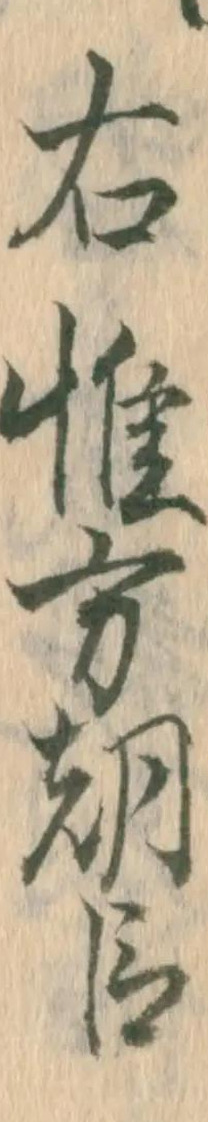右惟方朝臣
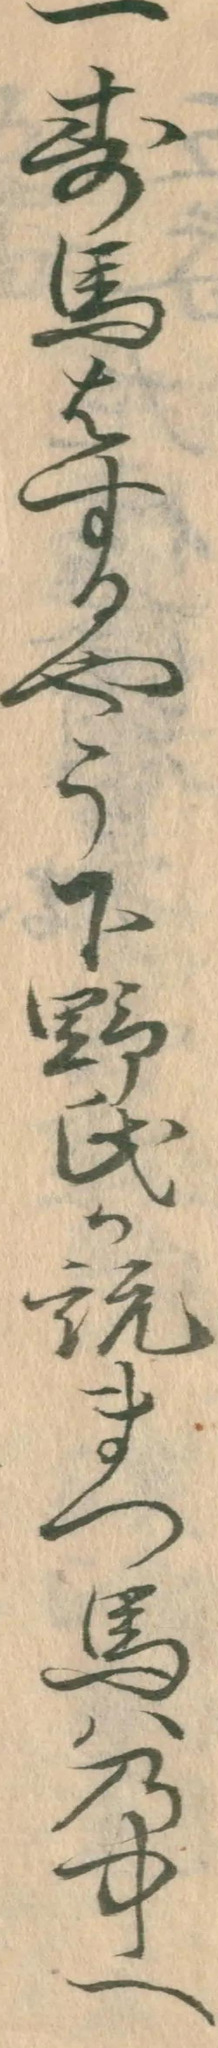一す馬はするやう下野氏か説まつ馬はの中へ
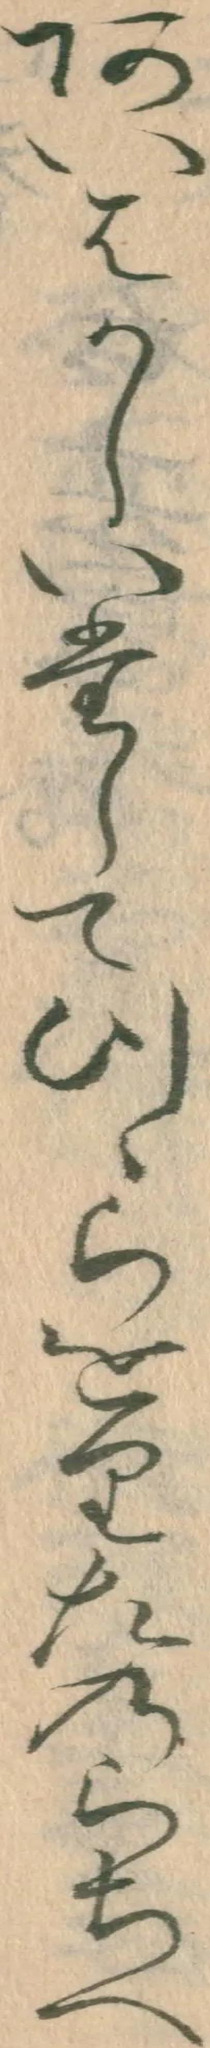あいはかしいたしてつゝらをり左のらちへ
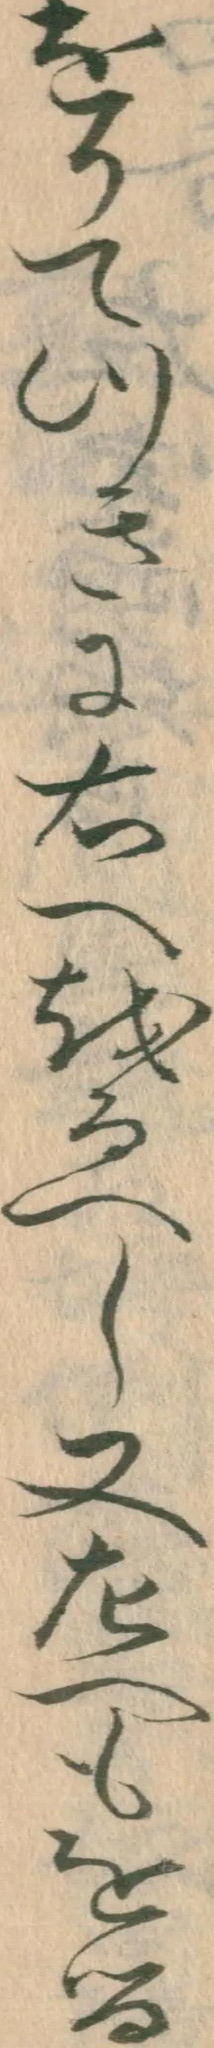をりてつきに右へをるへし又左へもをる
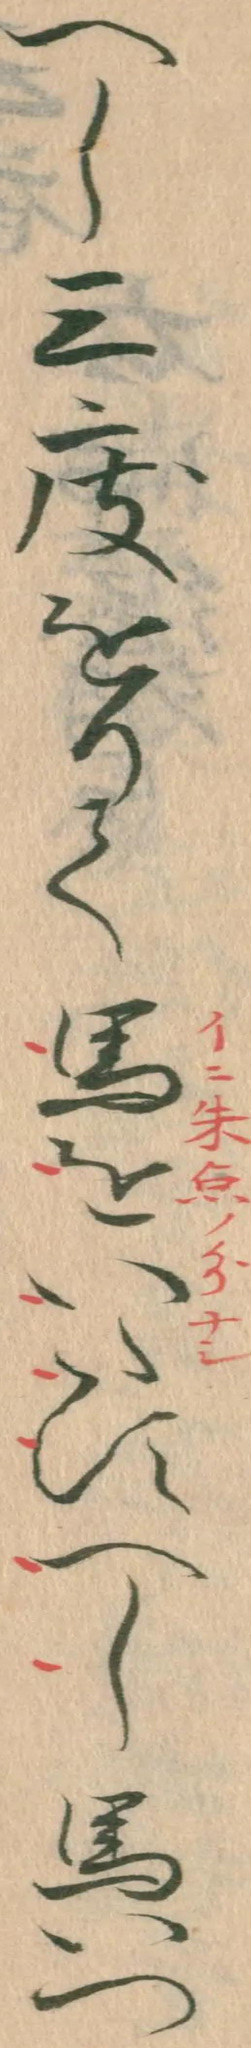へし三度をりて「馬をいたすへし」馬いつ
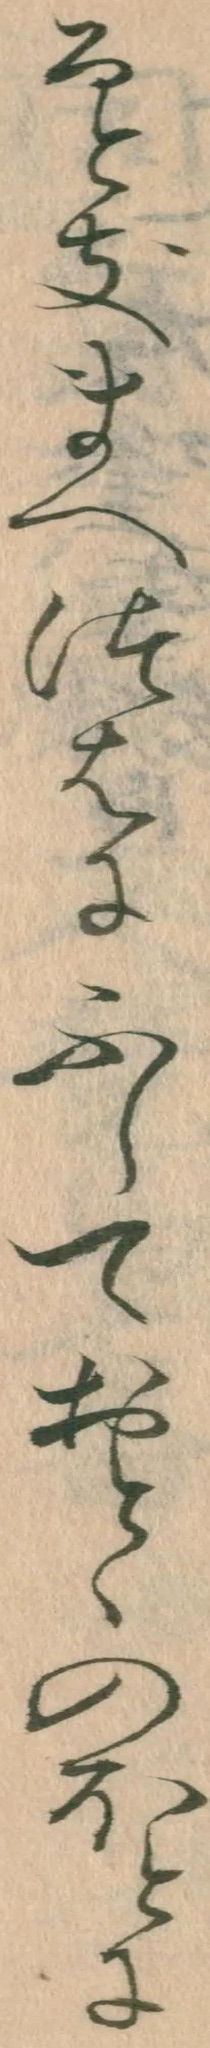るときまへつはにふしておとゝのほとに
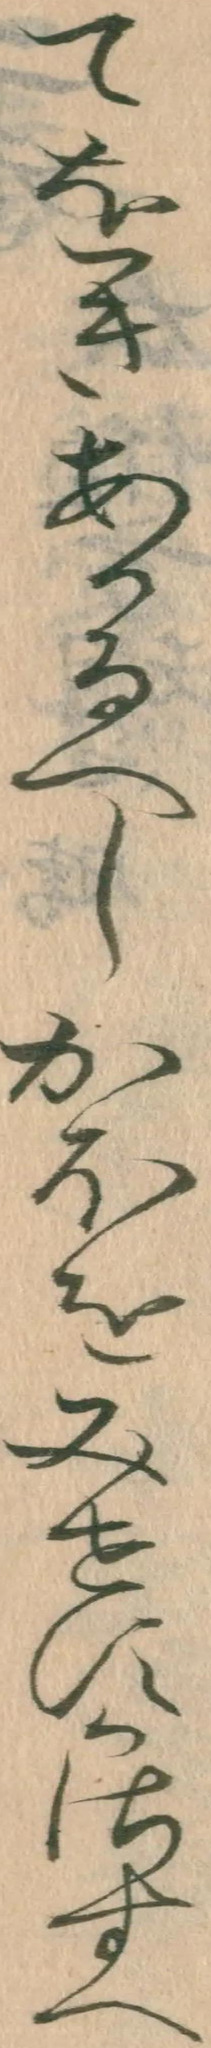てをきあかるへしかほをみせすかさすへ
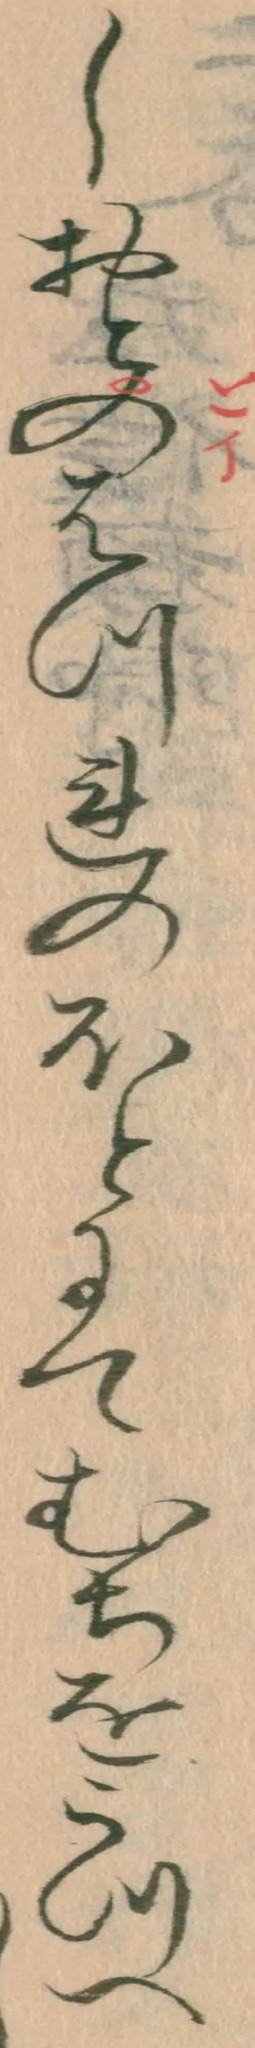しおと◦のはつれのほとにてむちをうつへし
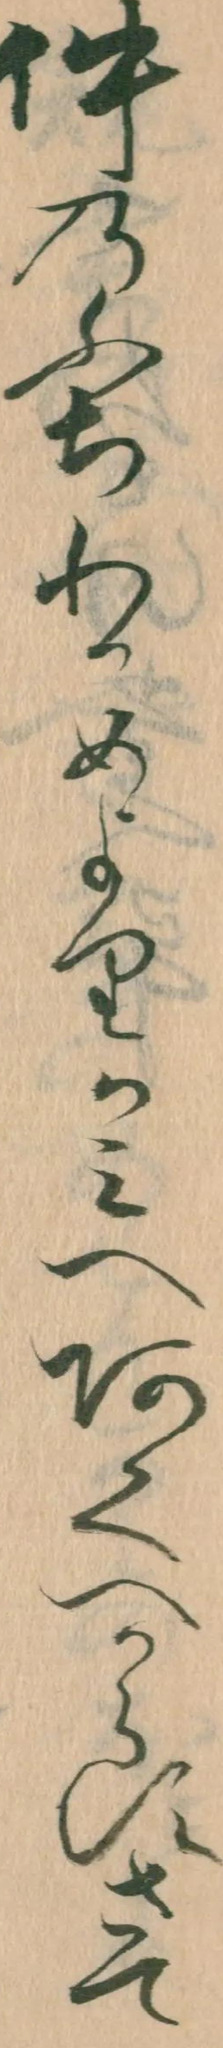件のふちわかめよりかみへあくへからすさて
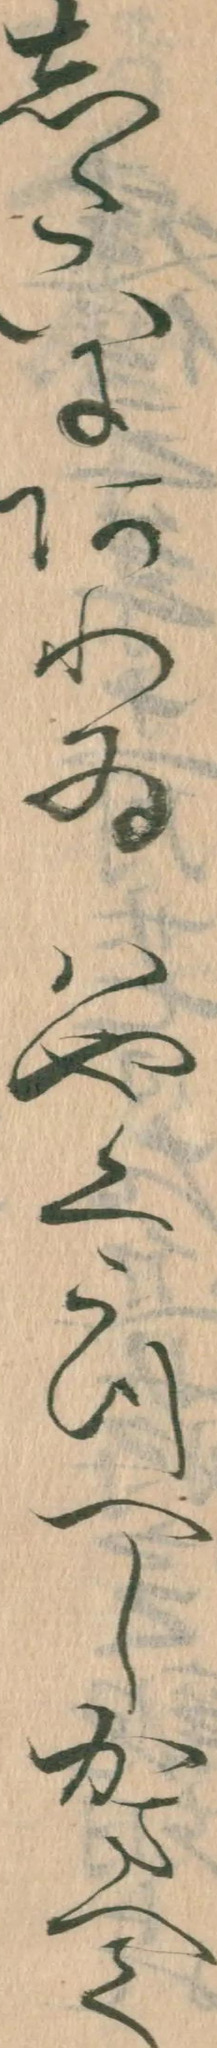したいにあわゐはやくうつへしかまへて
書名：賀茂社記録. 第13冊
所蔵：国立国会図書館 National Diet Library, JAPAN
